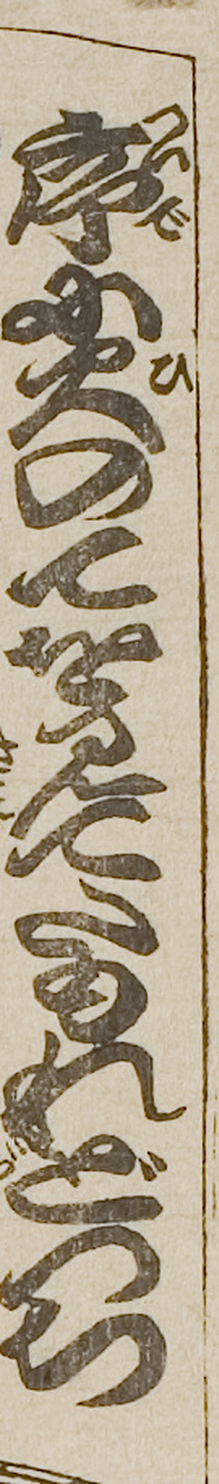序に火のてを見てたもれどつち
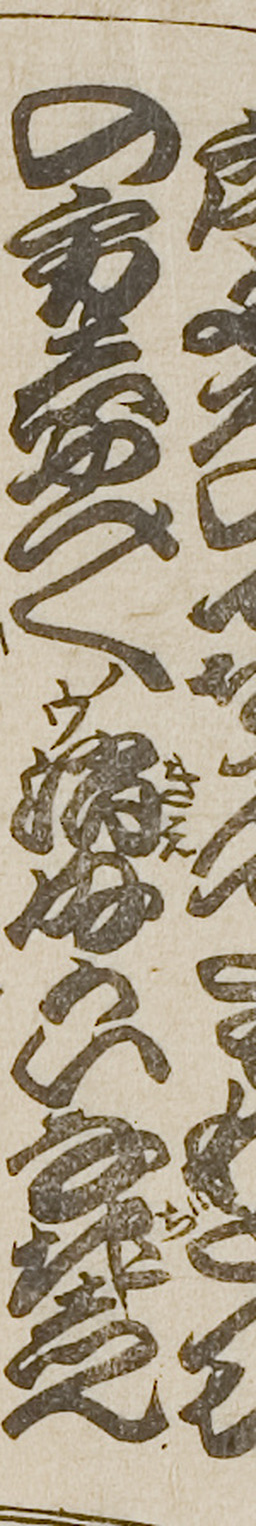の方しゆへ〳〵ノウ消ぬかいな地しん
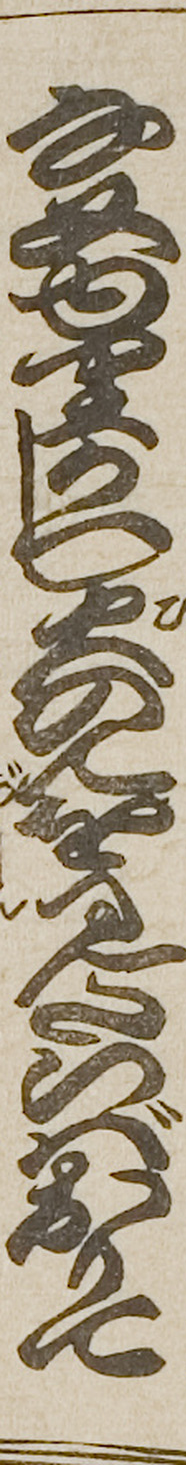なめゆりかいし火のてを見たいばかりて
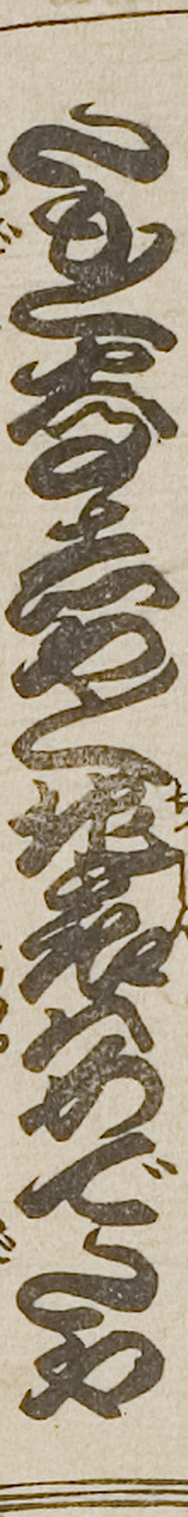たも〳〵火事しや〳〵地震はめでたや
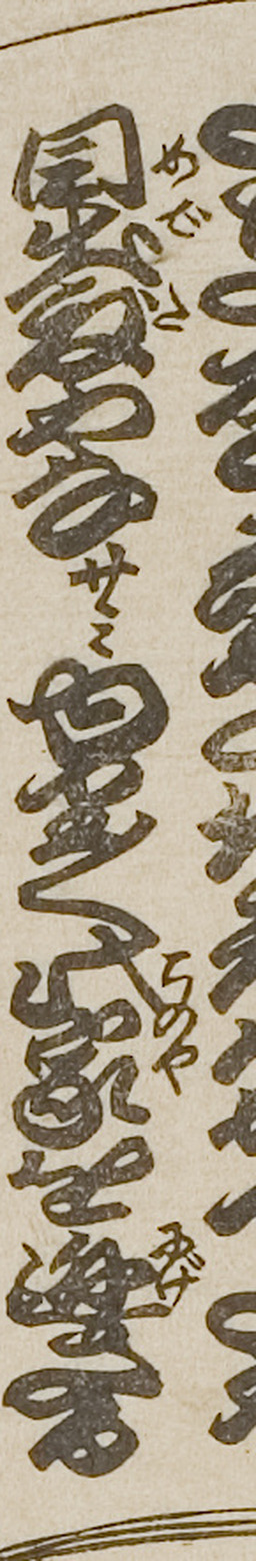目出度やなサミゆり〳〵此家を逃さる
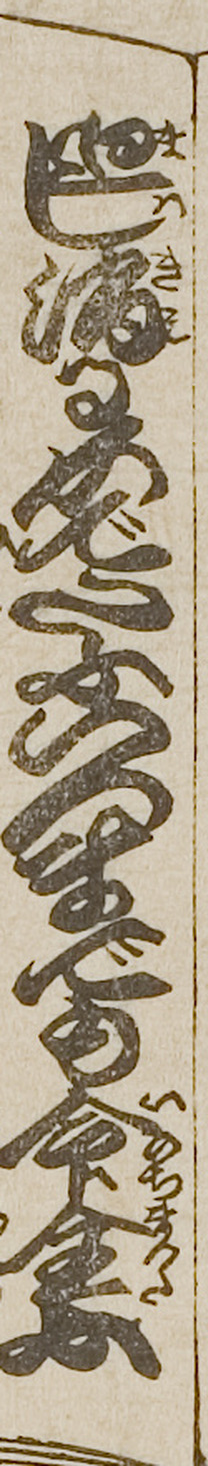廻し消るめでたにいつまでも命全ふ
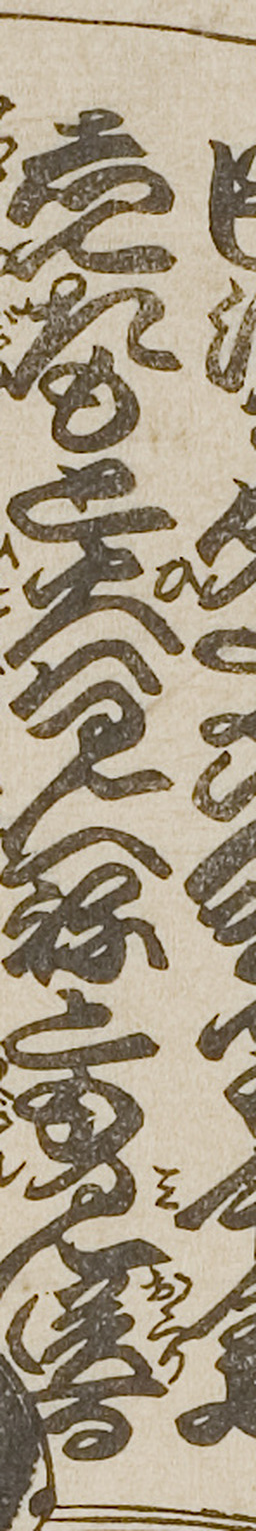してたもと火は見へねとも見送る
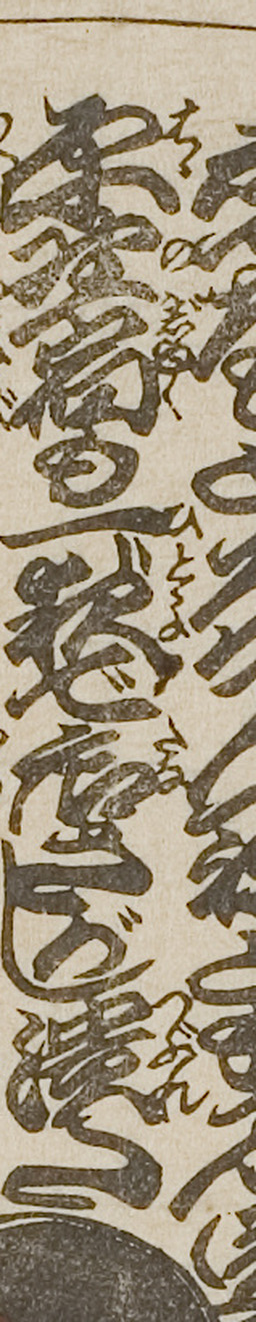原野宿も一夜で店さがし潰た
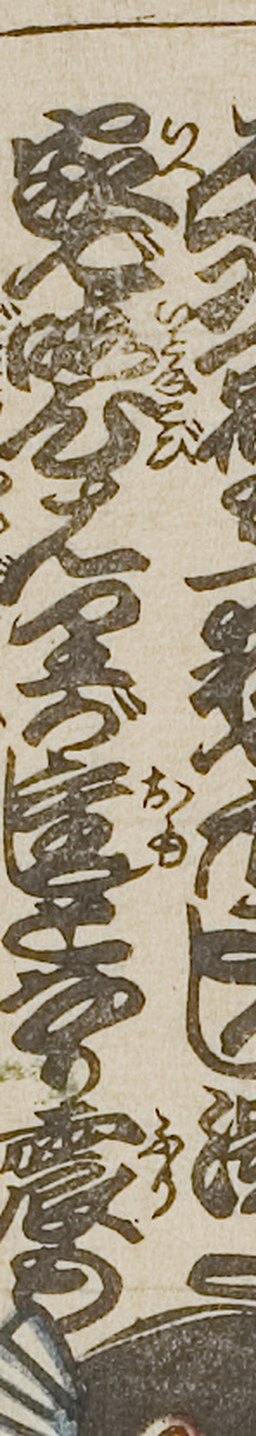家で暇乞はりが重しとなり震も
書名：[鯰の子回し]
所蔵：東京大学総合図書館 General Library in the University of Tokyo, JAPAN
